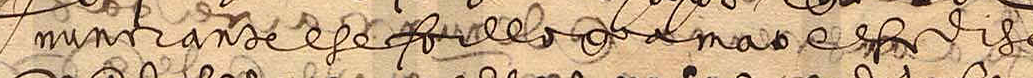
nunciante lhe foi llogo a mao e lhe dise
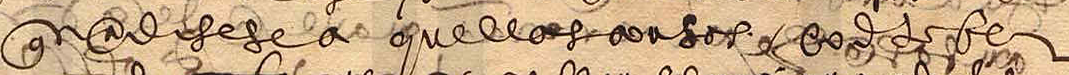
q̄ nā disese aquellas cousas / e o dito ber
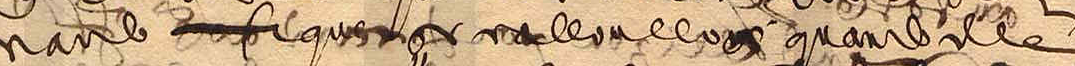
nardo fique se callou llogo quando elle
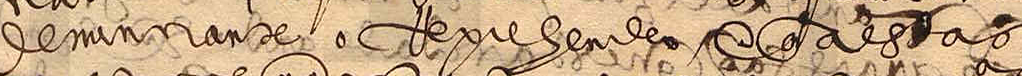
denunciante o Reprehendeo / e q̄ a estas
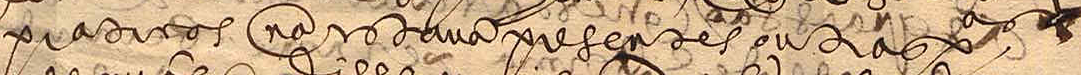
praticas nā estauā presentes outras pas
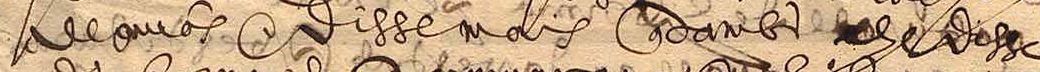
allguuās e disse mais q̄ tambē lhe disse
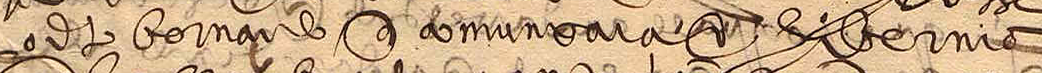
o dito bernado q̄ comungara ē hibernia
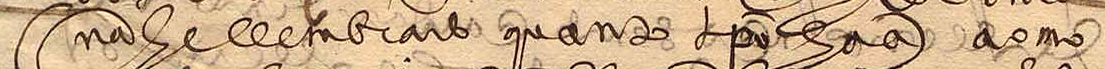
(nā he llembrado quanto tpō haa) ao mo
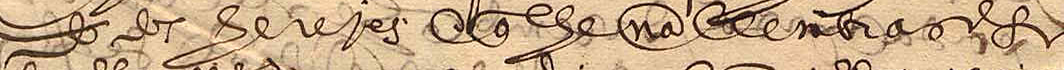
do dos herejes e q̄ lhe nā llembra se lhe
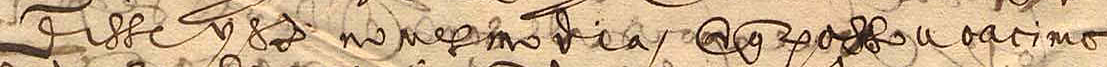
disse ysto no mesmo dia / ē q̄ passou o acima
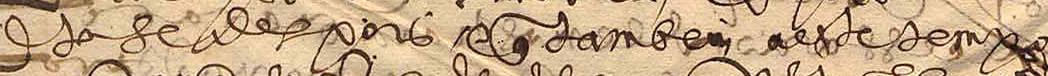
dito se despois / e q̄ tambem a este tempo
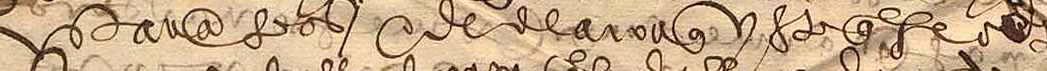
estauā soos / e declarou q̄ ysto q̄ lhe o dto
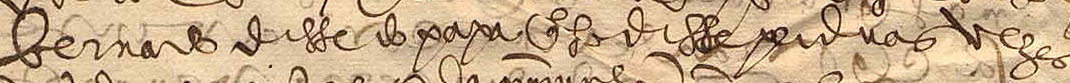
bernardo disse do papa q̄ lhe disse per duas vezes
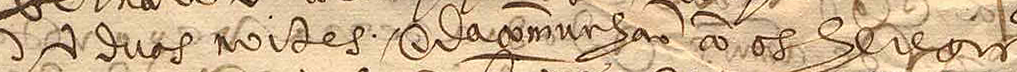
e ē duas noites / e da cōmunhaõ c̄o os hereges
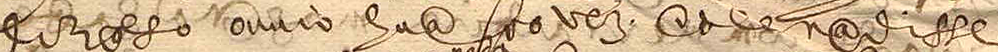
diz q̄ lho ouuio huā soo vez. e all nā disse
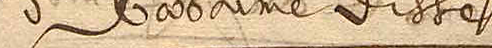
e do costume disse
